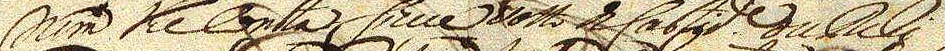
nem lhe consta fizeçe votto de Castid.e ou Reli
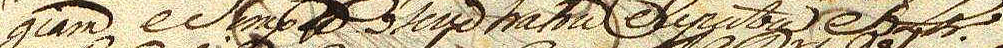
giam e Sempre o teve tratou e Reputou SoLtr.o
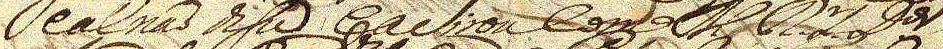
e al não disse e aSinou com o M R. S. D.or
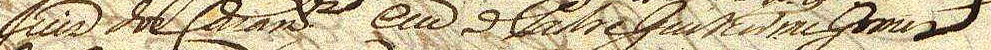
Juiz dos Cazam.toz e eu o Padre Guilherme Gomez
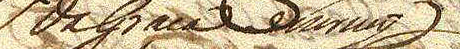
da Graça escrevy
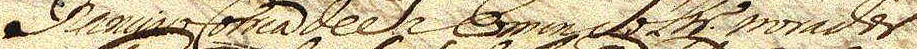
Francisco Correa de Sa homen Soltr.o morador
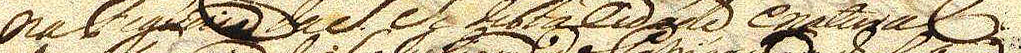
na Freguezia da S. Se desta Cidade e natural
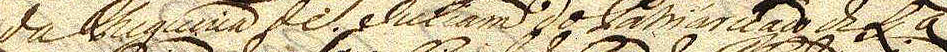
da Freguezia de S. Iuliam do Patriarchado de Lx.a
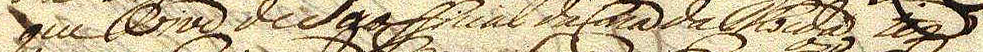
que Vive de Ser official da Caza da Moeda tes
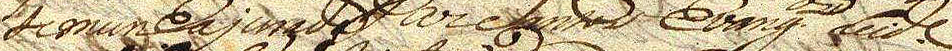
temunha jurada aos Santoz Evang.oz de id.e
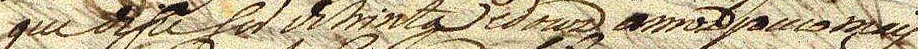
que disse ser de trinta e douz annoz pouco mais
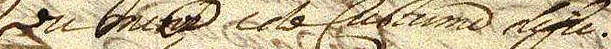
ou menoz, e do Costume disse.
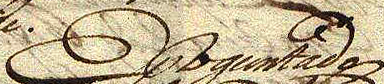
E proguntado
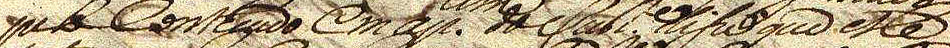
pelo Contheudo em a p.am do Iust.e disse que elle
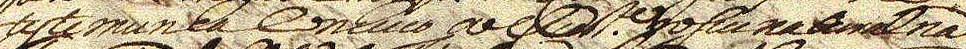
testemunha conheceo ao Iust.e no seu natural na
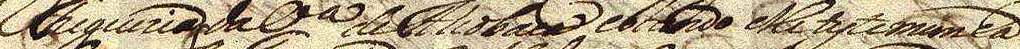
Freguezia de Va de Alcobaca estando elle testemunha
